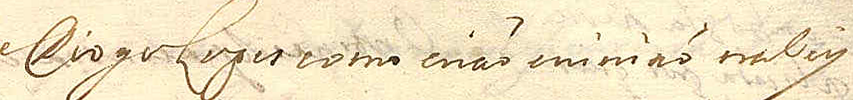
Diogo Lopes como criaõ e uiuiaõ na ley
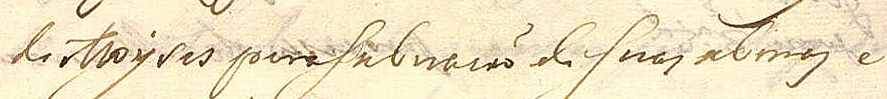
de Moyses para Saluacaõ de Suas almas e
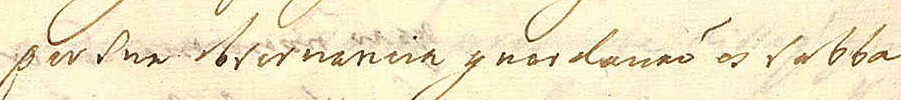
por sua obseruancia guardauaõ os sabba
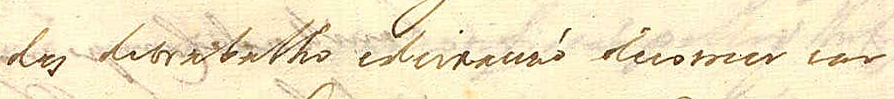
dos de trabalho e deixauaõ de comer car
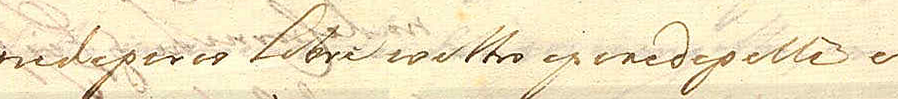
ne de porco Lebre coelho e pexe de pellē e
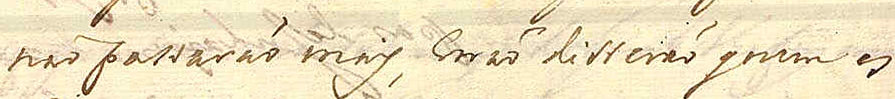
naõ passaraõ mais, E naõ disseraõ quem os
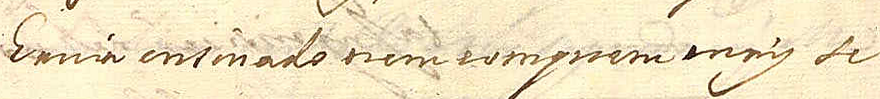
hauia ensinado nem com quem mais se
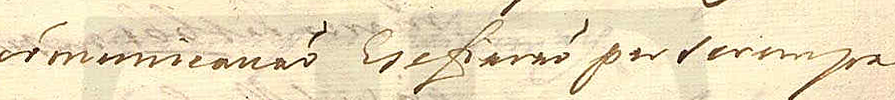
com̄unicauaõ E se fiaraõ por serem pa
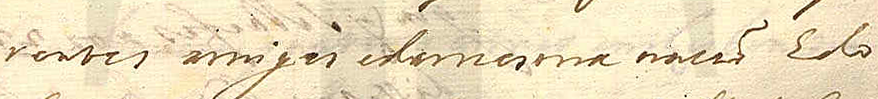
rentes amigos e da mesma nacaõ E do
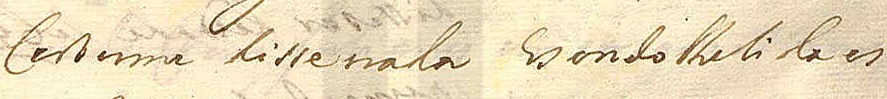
Costume disse nada E sendo lhe lida es
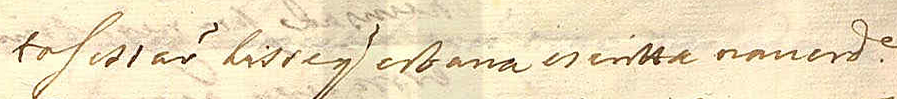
ta Sessaõ disse q̄ estaua escritta na uerd.e
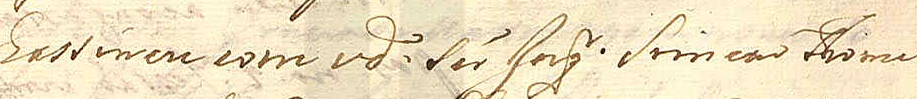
E assinou com o d.o sor̄ Jnqr. Simeaõ Thome
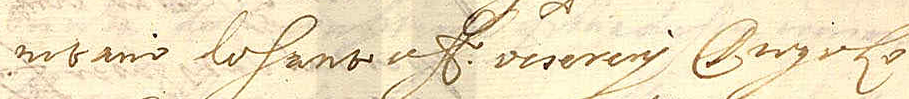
notario do Santo off.o o escreuj, Diogo Lo
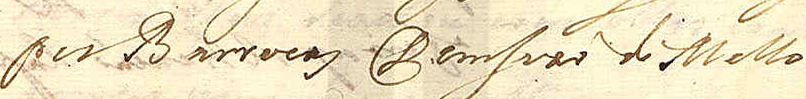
pes Barrocas Dom Joaõ de Mello
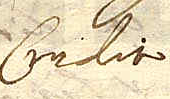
Credito
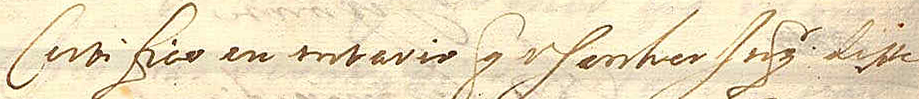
Certifico eu notario q̄ o Senhor Jnqr. disse
